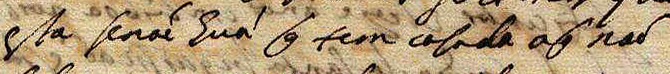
esta senaõ huā q̄ tem casada a q̄ naõ
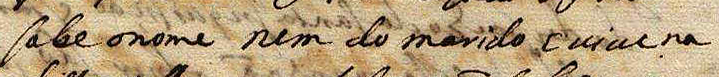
sabe o nome, nem do marido e uiue na
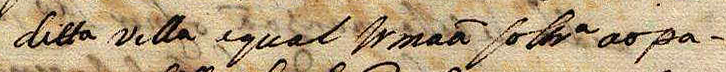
ditta villa a qual Irmaã soltra ao pa
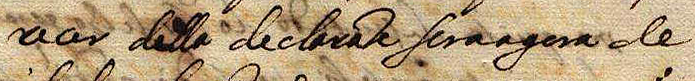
recer della declarāte sera agora de
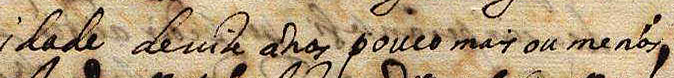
jdade de uīte anos pouco mais ou menos
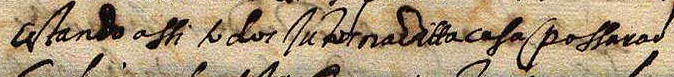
Estando assi todos Jūtos na ditta casa (passaraõ
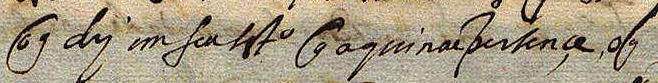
o q̄ diz em seu testo q̄ aqui nao pertence o q̄
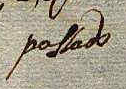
passado
